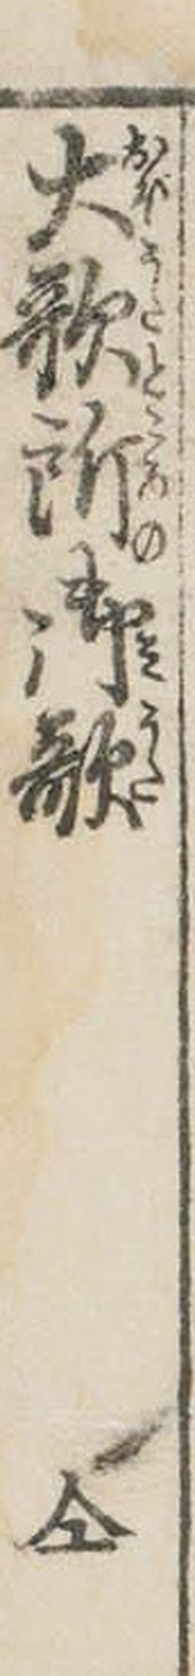大歌所御歌同

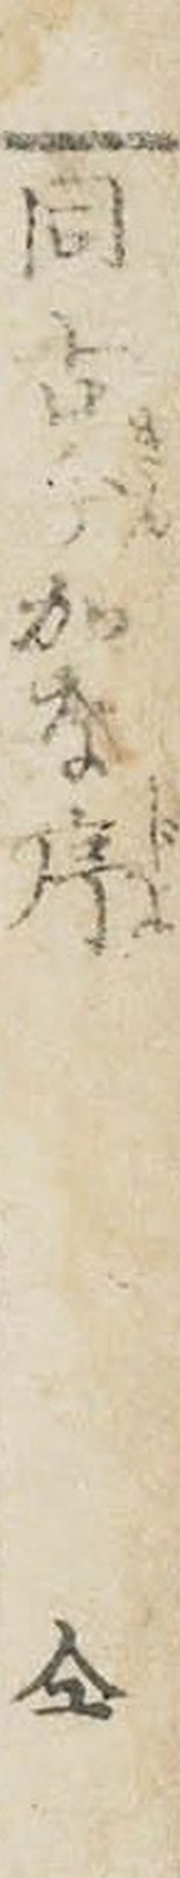同古今かな序同
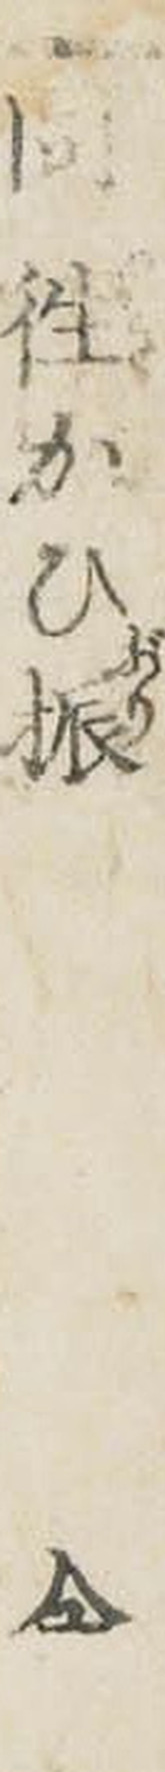同往かひ振同
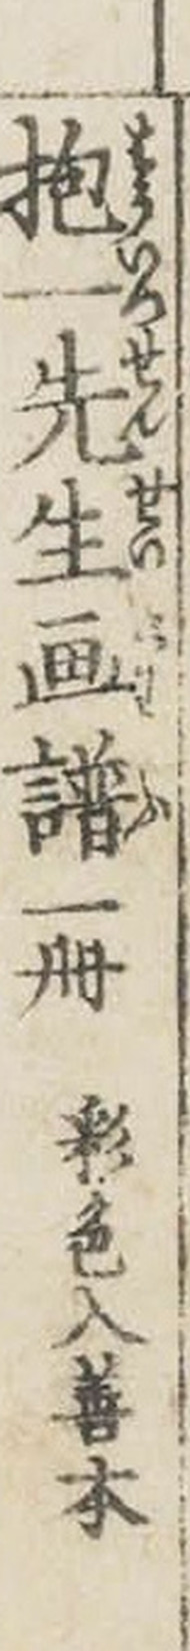抱一先生画譜彩色入善本
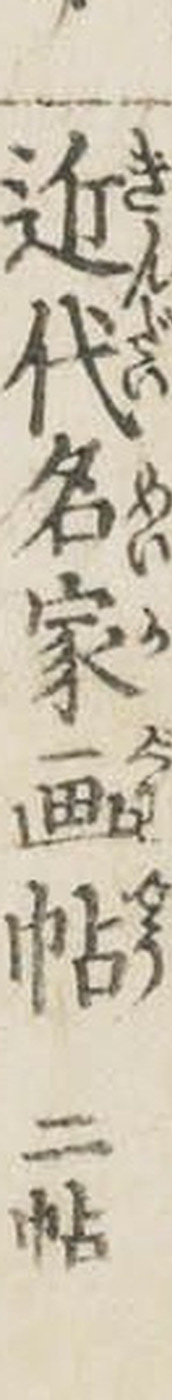近代名家画帖二帖
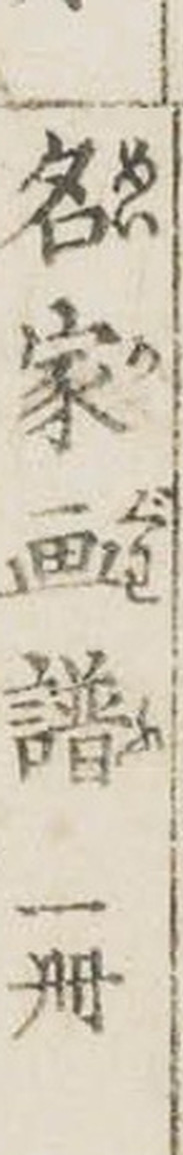名家画譜一冊
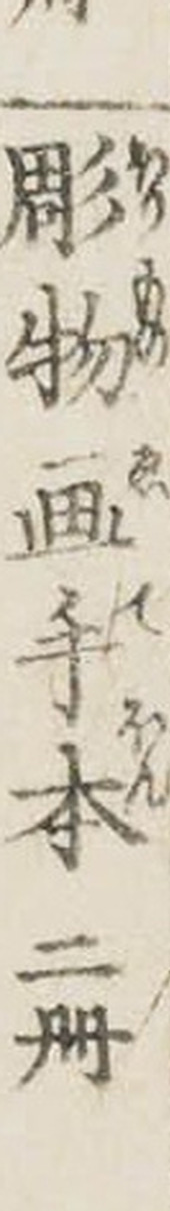彫物画手本二冊
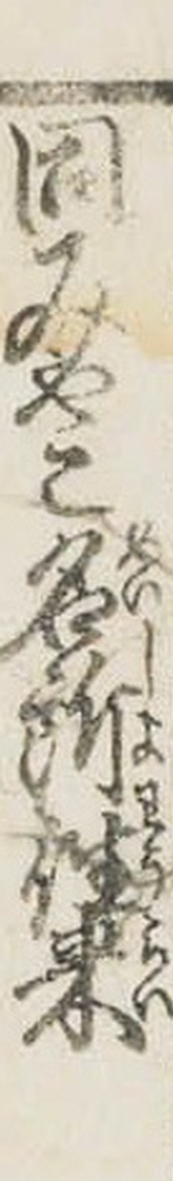同みやこ名所往来同
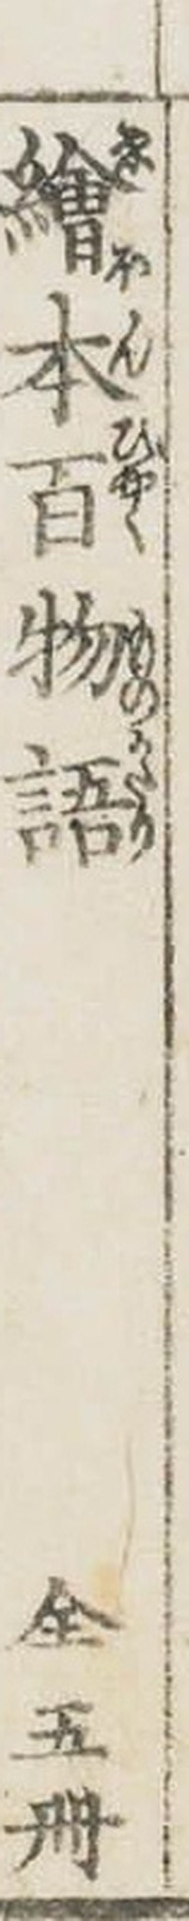絵本百物語全五冊
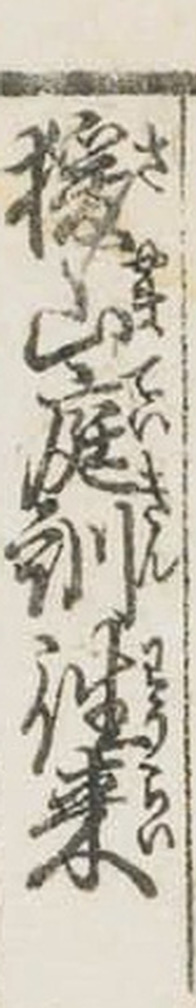猨山庭訓往来同
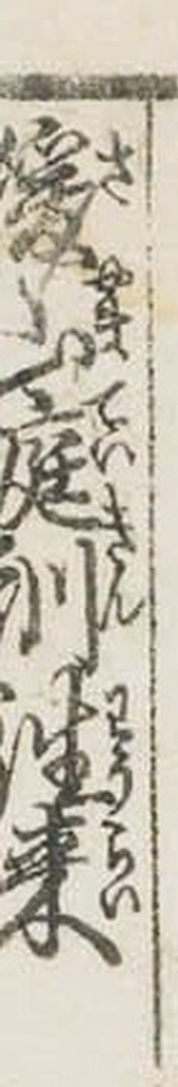猨山庭訓往来同
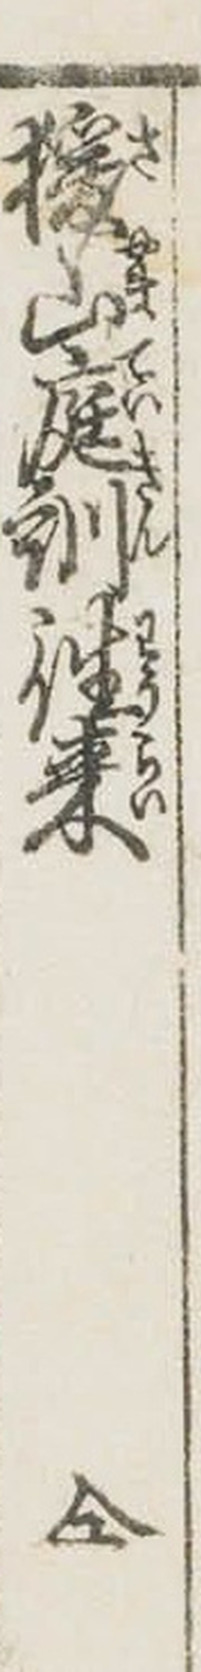猨山庭訓往来同
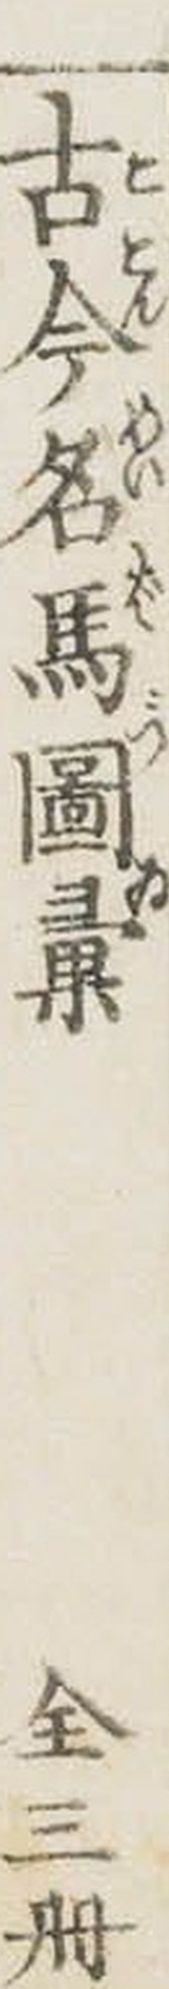古今名馬図彙全三冊
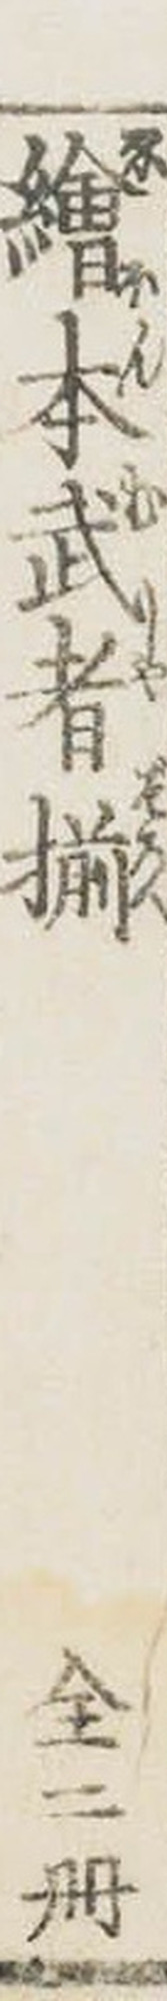絵本武者揃全二冊
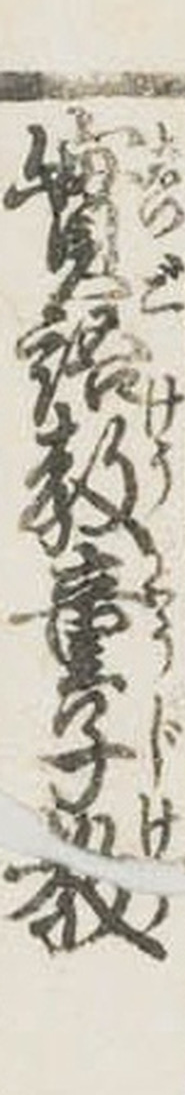実語教童子教同
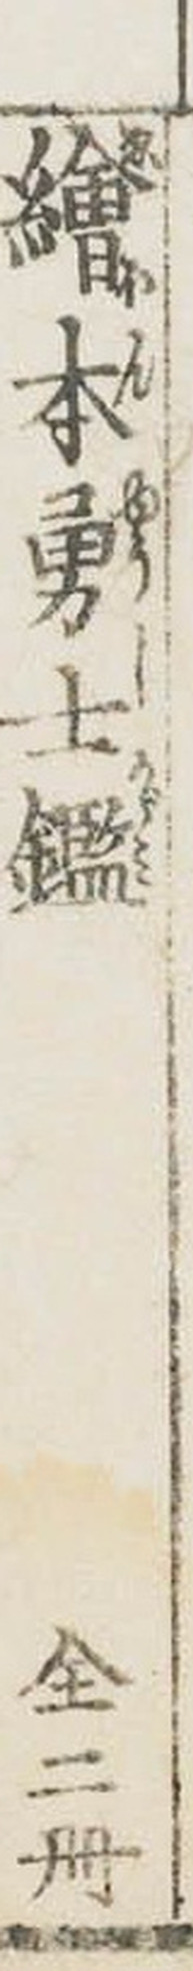絵本勇士鑑全二冊
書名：源氏百人一首
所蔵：東京学芸大学教育コンテンツアーカイブ
